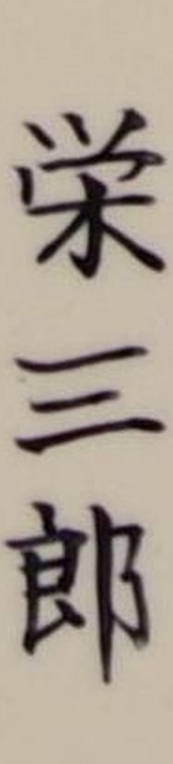栄三郎
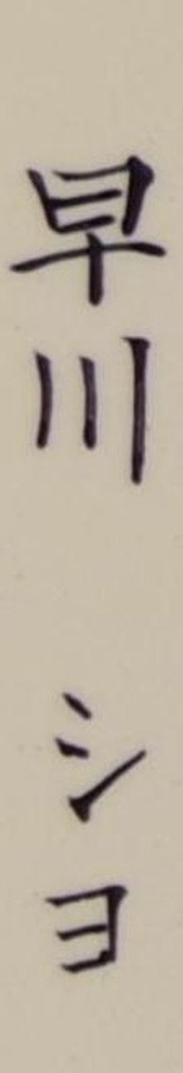早川シヨ

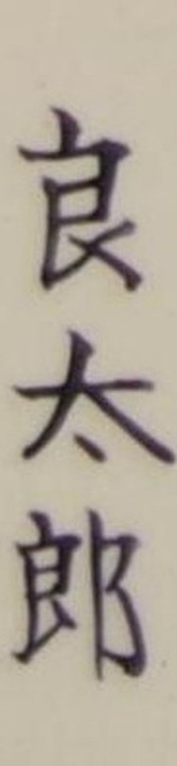良太郎

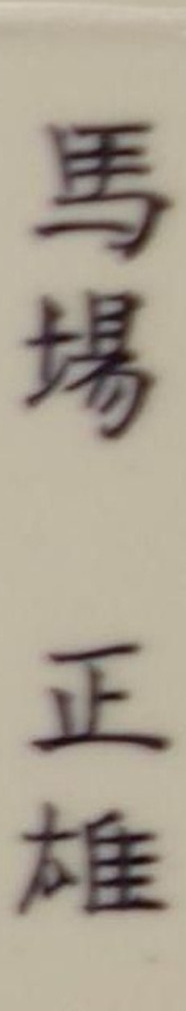馬場正雄
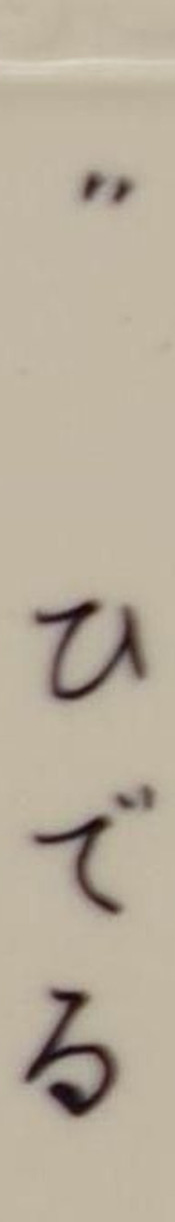ひでる
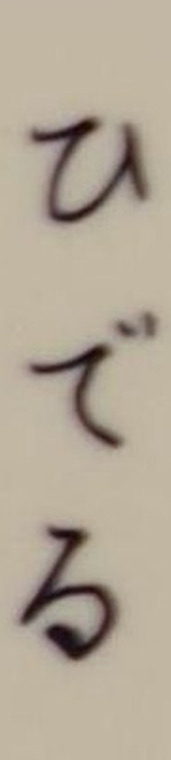ひでる
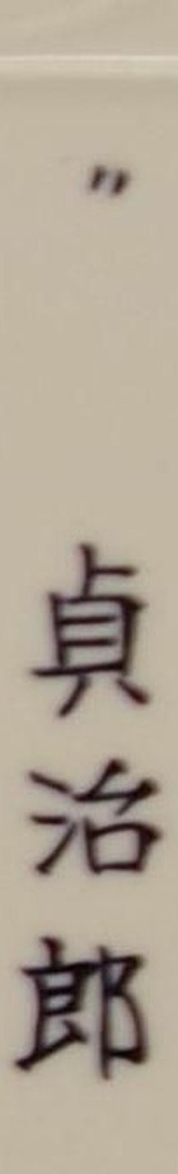貞治郎
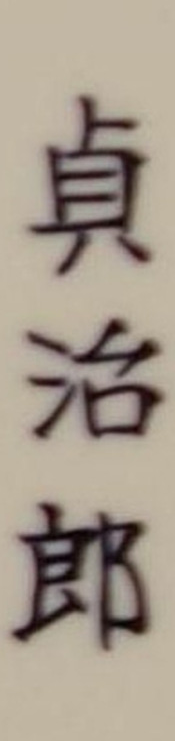貞治郎
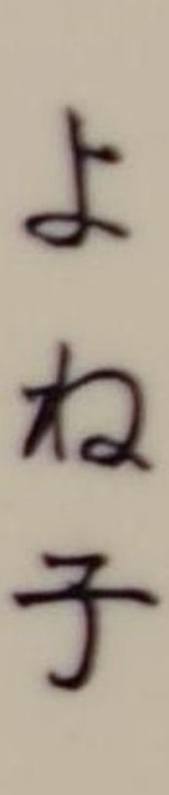よね子
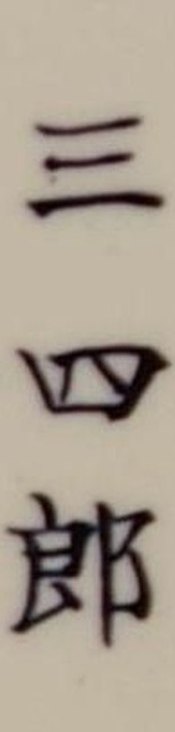三四郎
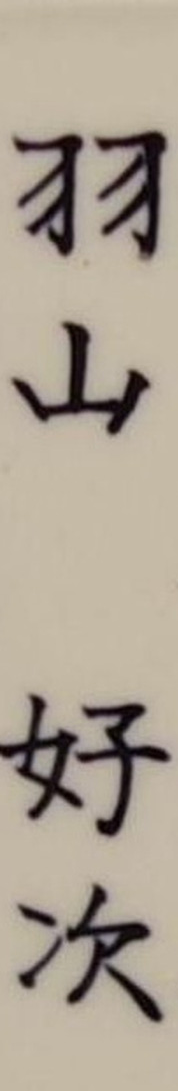羽山好次
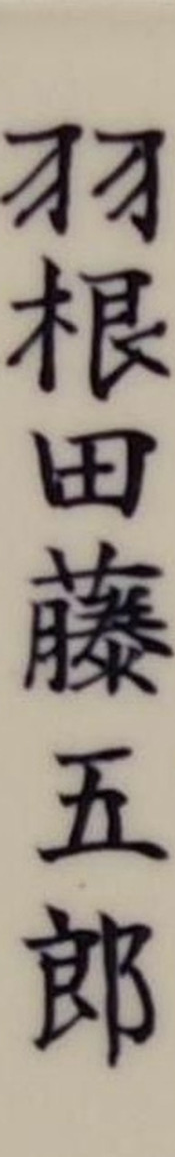羽根田藤五郎
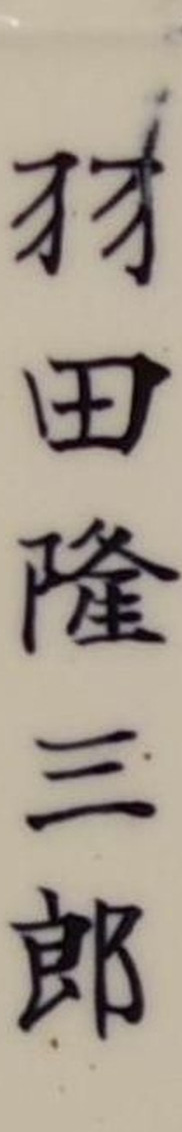羽田隆三郎
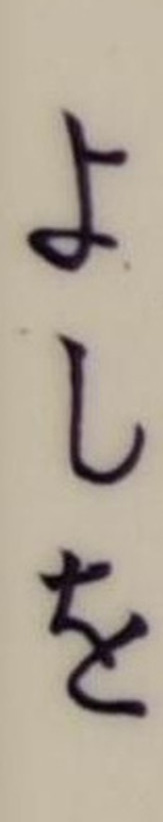よしを

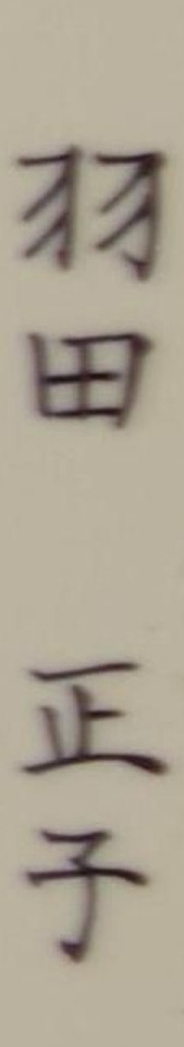羽田正子
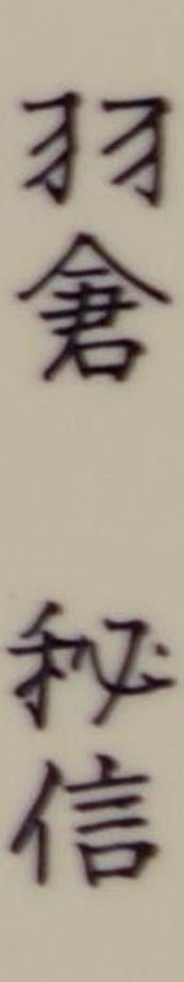羽倉秘信
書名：M~S
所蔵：高野山金剛峯寺
